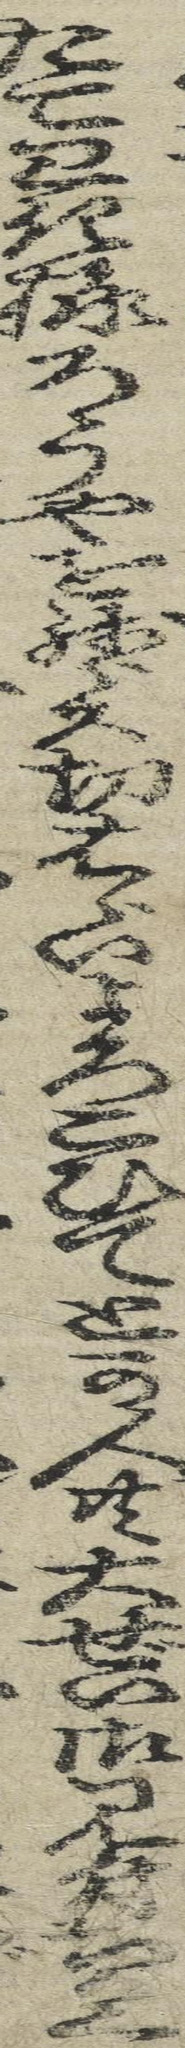たてわき様ろうやを残らす切はらいよろこひてとか人共大ぜい御見付ちかく
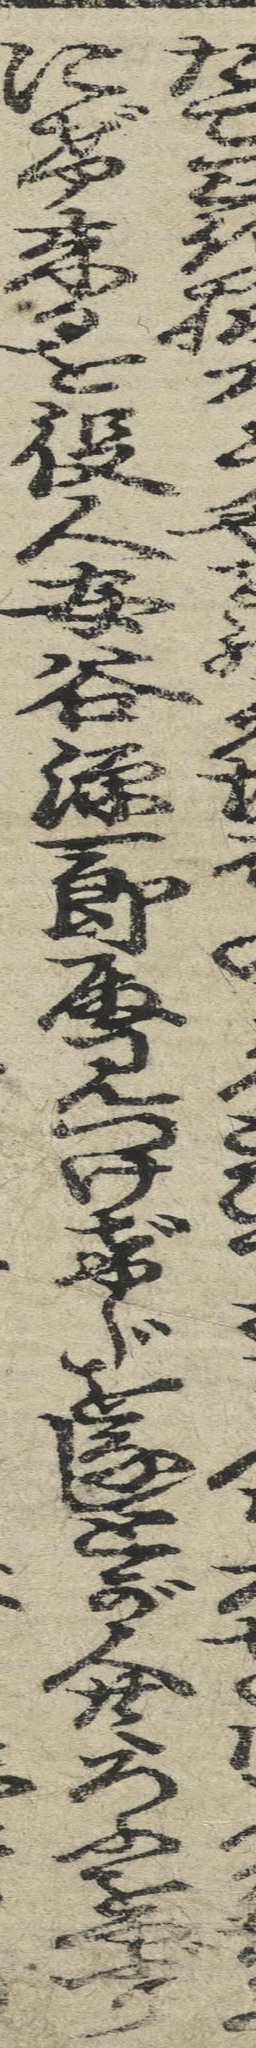にげ来るを役人安谷源一郎殿見つけげじをなしとが人共ろふをやぶり
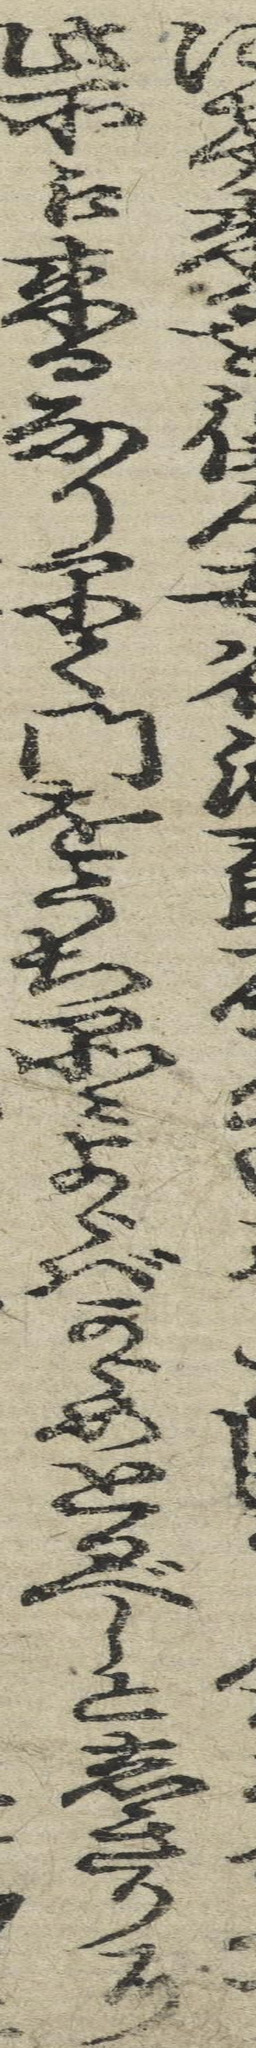此所へ来るなり早く門をうち品によらばからめとるべしとしきりに
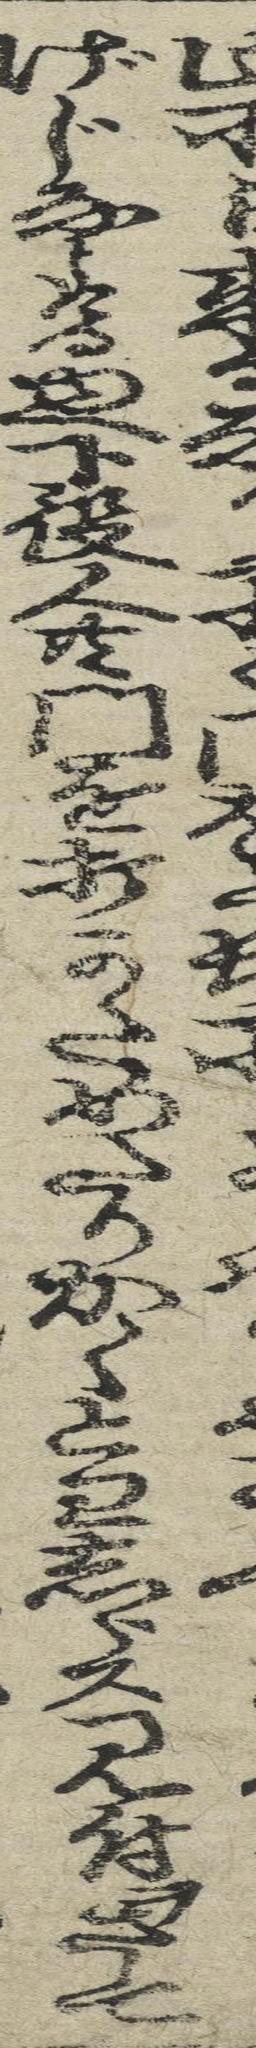げじなしけるゆへ下役人共門を打かためたりかくとわしらす見付をさして
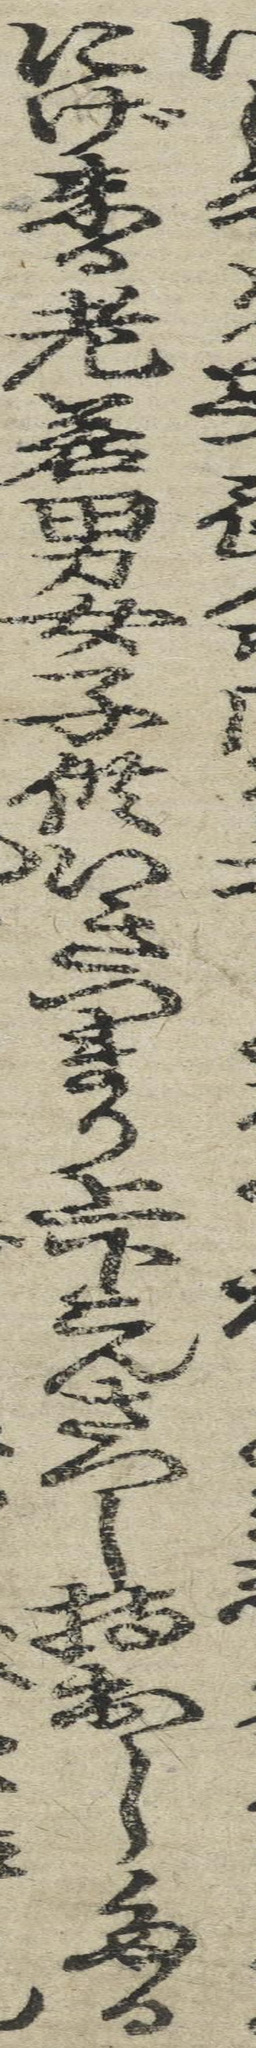にげ来る老若男女子供いきつまり上下こんさつし持出したる
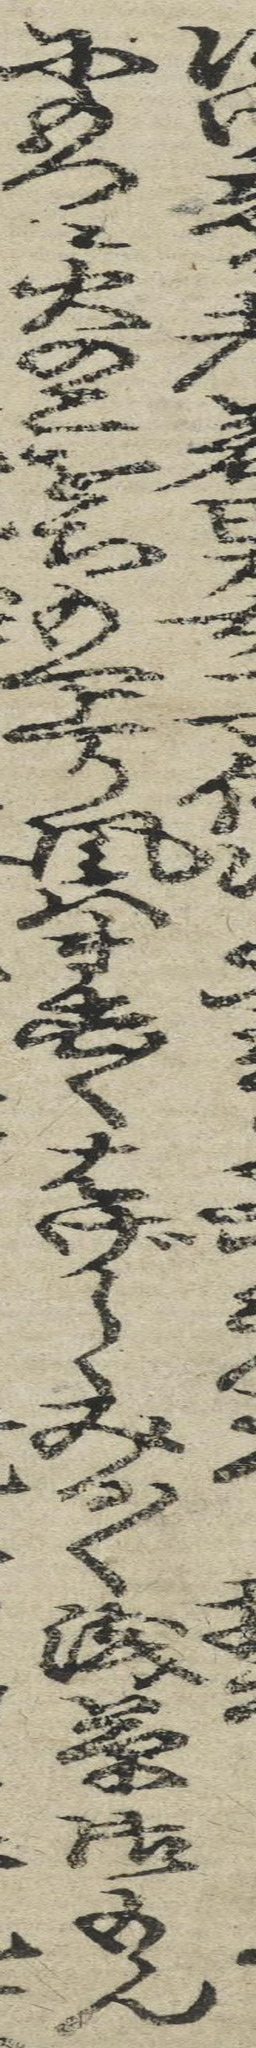にもつに火のこをちもへ上り風はます〳〵はげしくみる〳〵浅草御もん
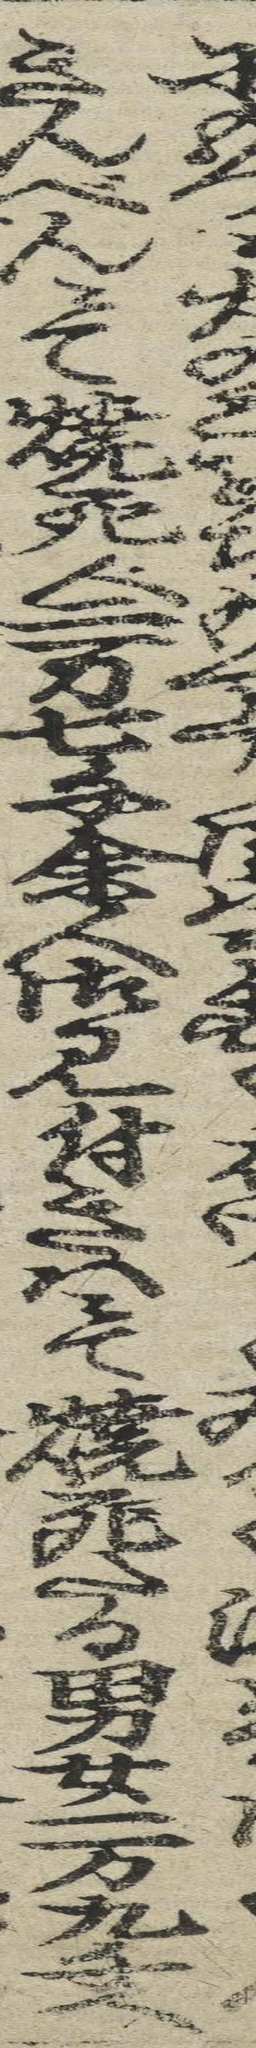きんべんにて焼死人二万七千余人御見付きはにて焼死たる男女一万九千人
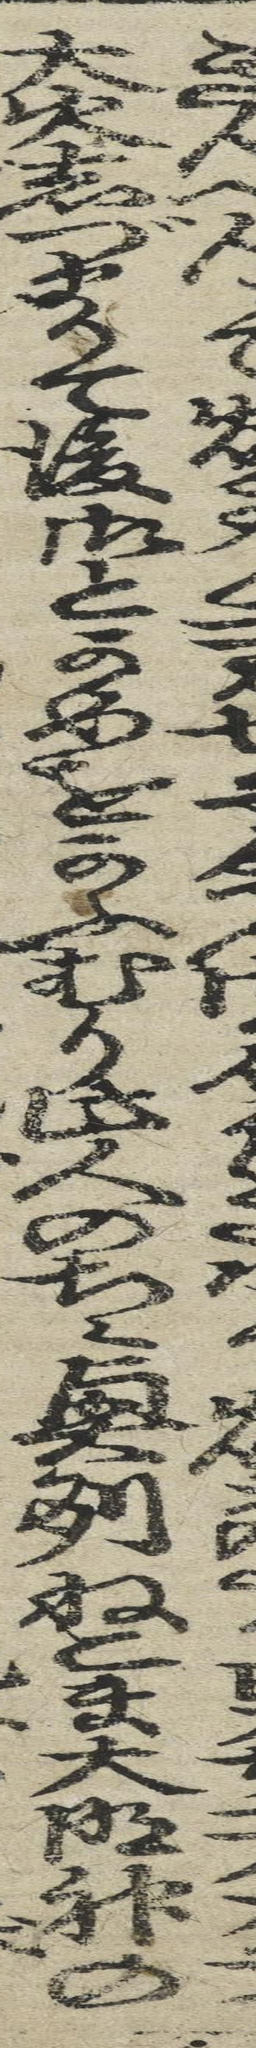大火しづまりて後御とかめをかふむり此人のちに奥州ねこま大明神の
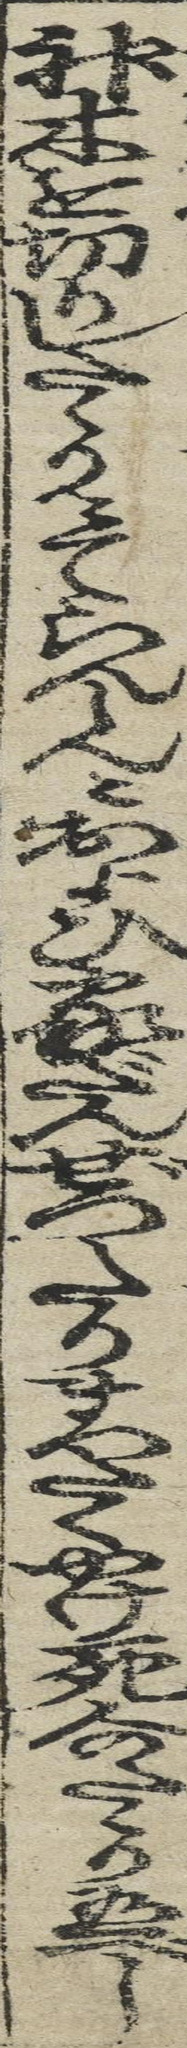神木を切りしたゝりにてらんしんにおよひ家だんぜつたりまつたくやけ死人のたゝり有べし
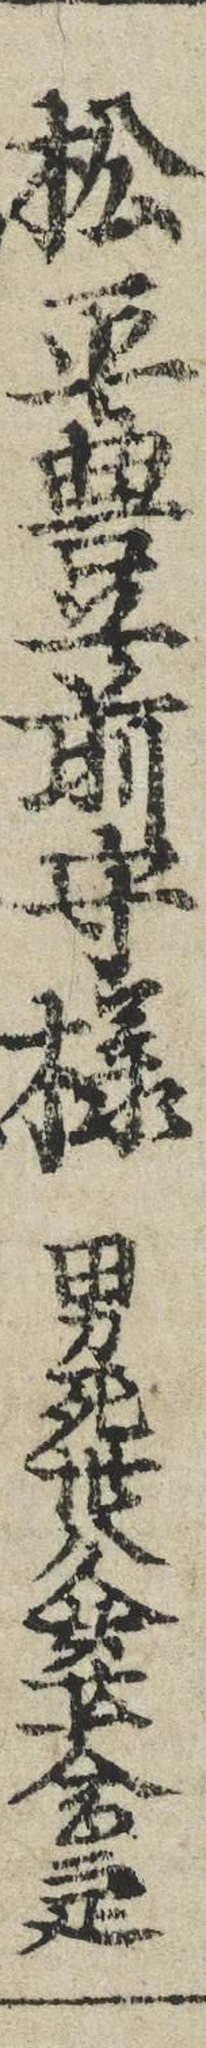松平豊前守様男死丗八人女廿一人馬二疋
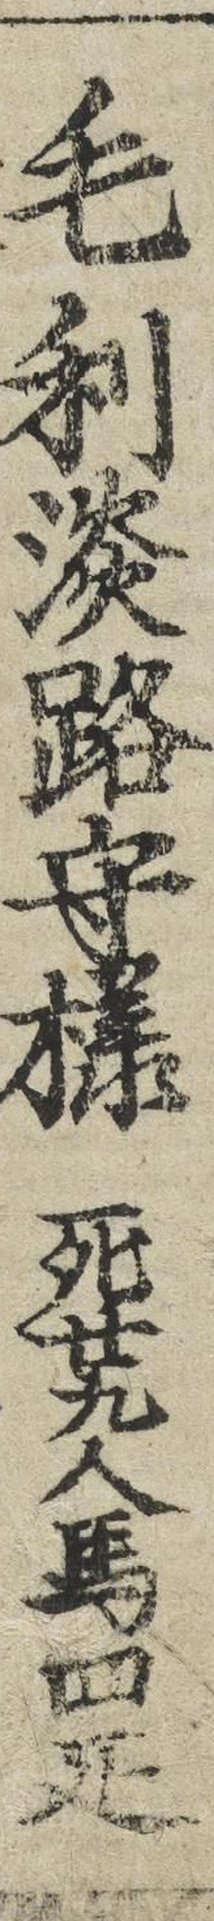毛利淡路守様死廿九人馬四疋
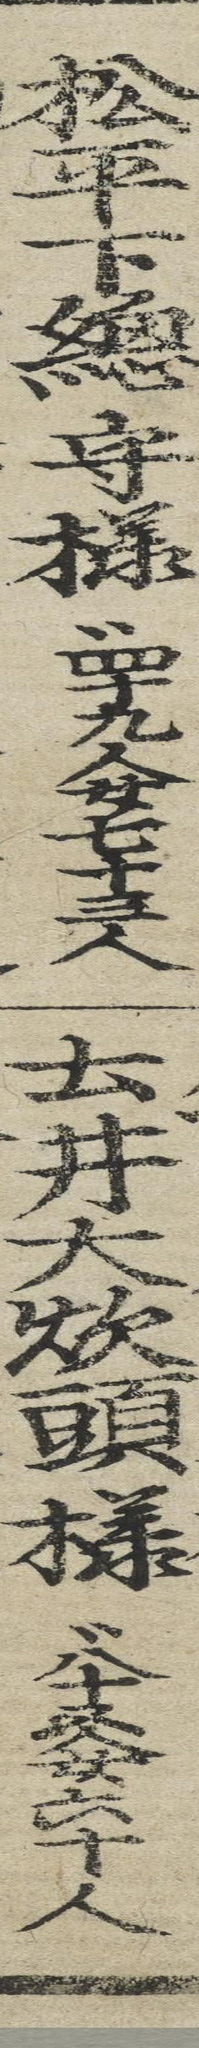松平下総守様〻四十九人女七十三人
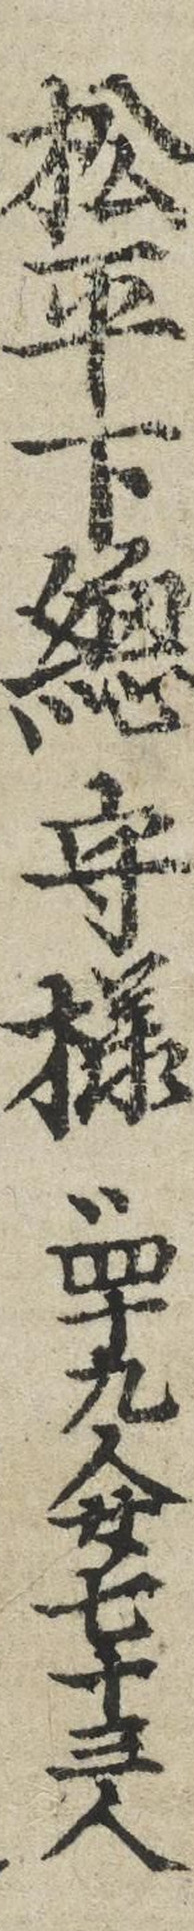松平下総守様〻四十九人女七十三人
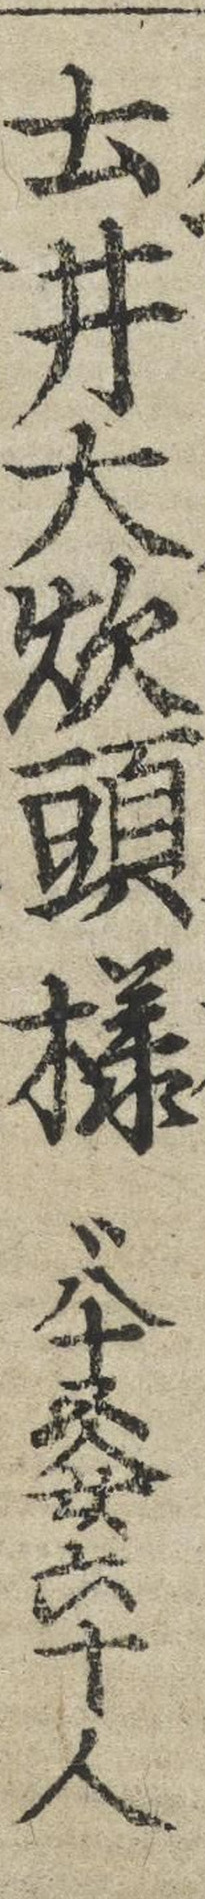土井大炊頭様〻八十五人女六十人
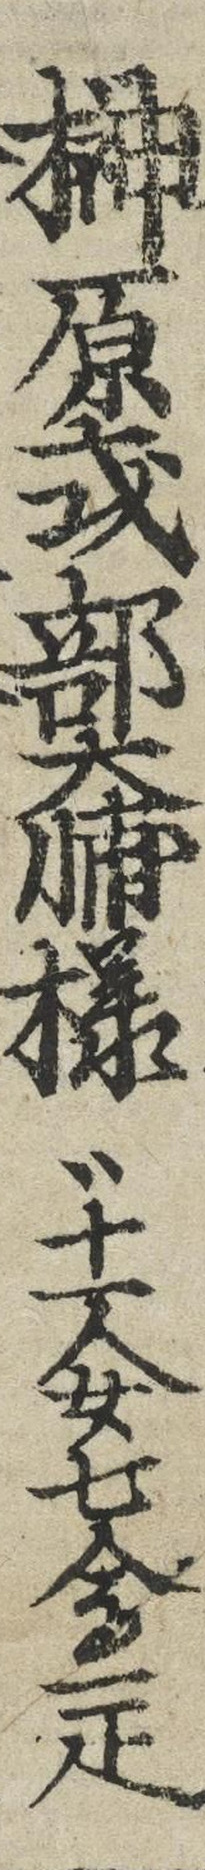榊原式部大輔様〻十一人女七人馬一疋
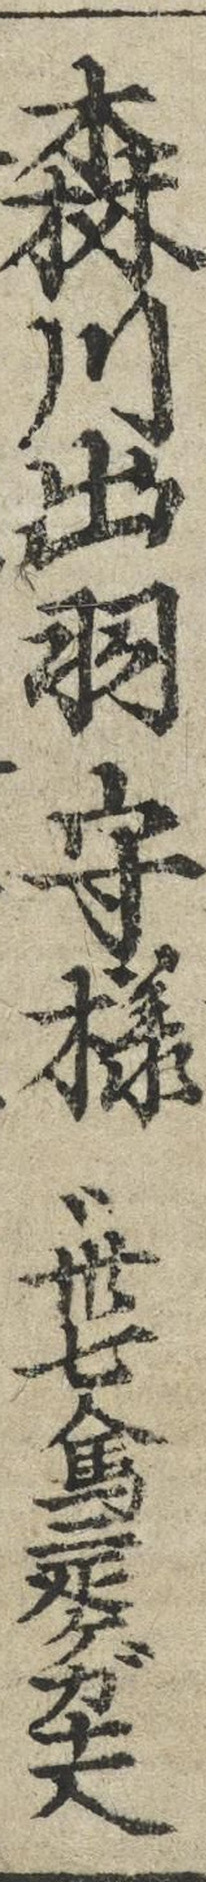森川出羽守様〻丗七人馬二疋ケガ十一人
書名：[明暦大火に関する冊子]
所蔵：東京大学地震研究所図書室 Earthquake Research Institute Library, The University of Tokyo, JAPAN
